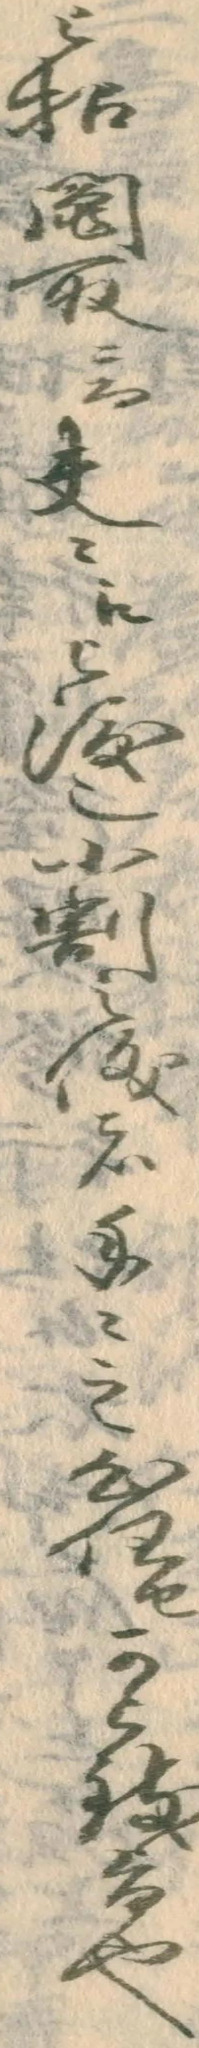被招鬮取ニ而夫々江被渡也小割之儀は手々之心任セ可被致旨也
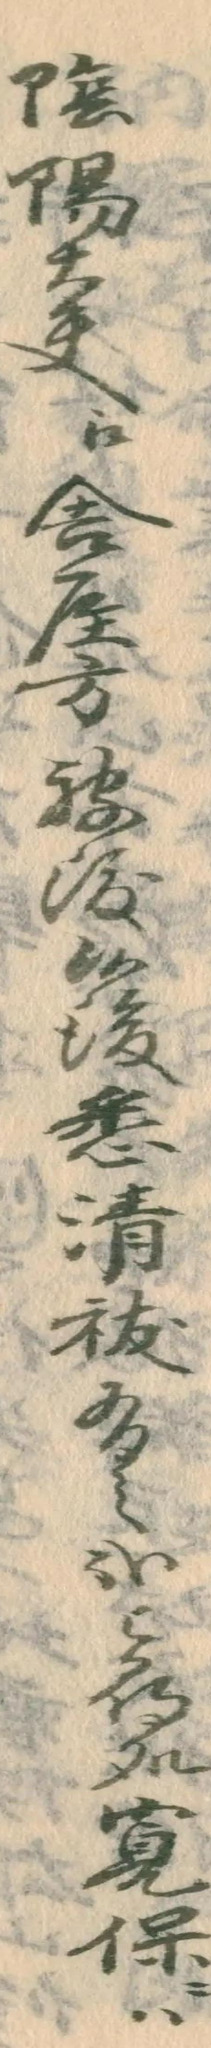一陰陽大夫江舎屋方被渡候後悉清祓有之哉被尋処寛保ニハ
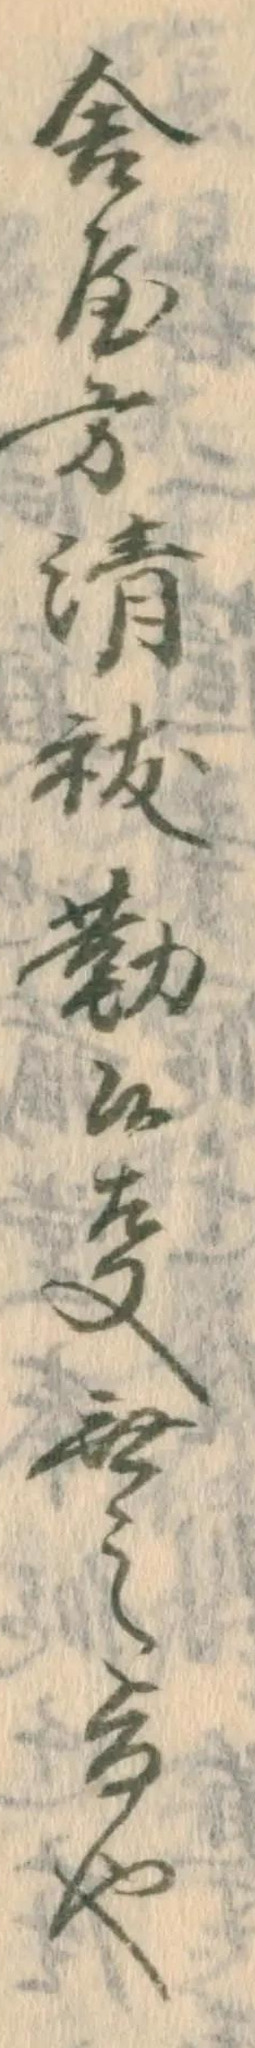舎屋方清祓勤候事無之旨也
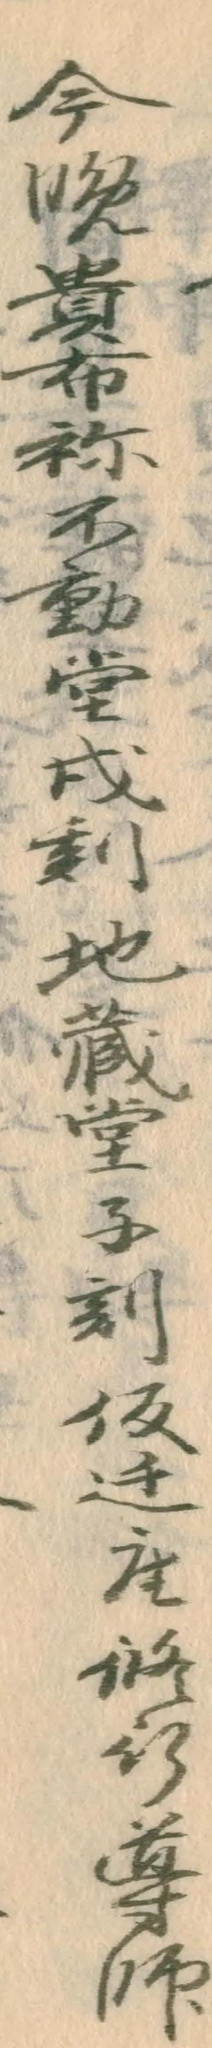一今晩貴布祢不動堂戌刻地蔵堂子刻仮迁座修行導師
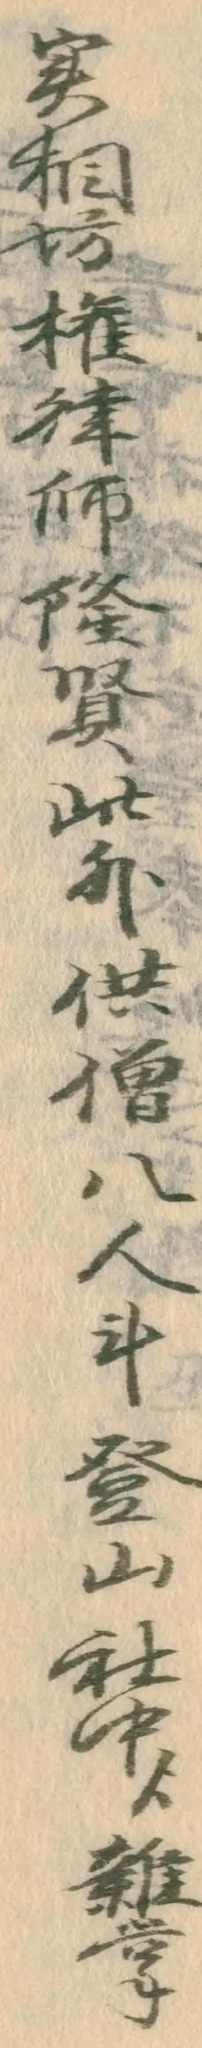実相坊権律師隆賢此外供僧八人計登山社中ゟ雑掌
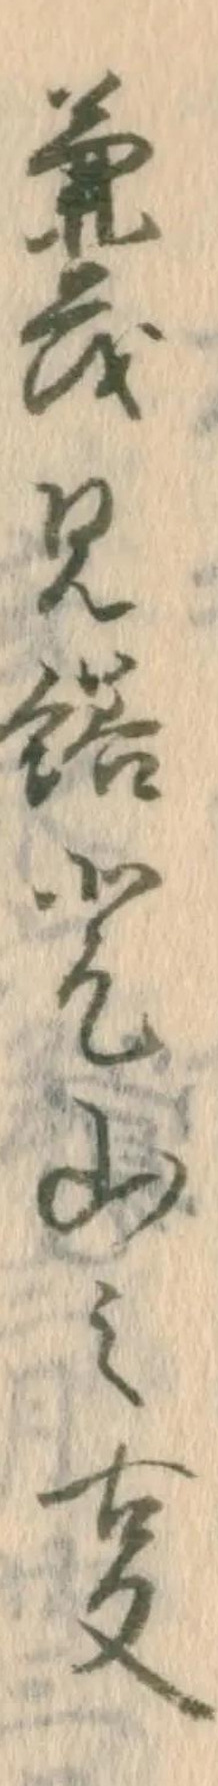兼茂見繕登山之事
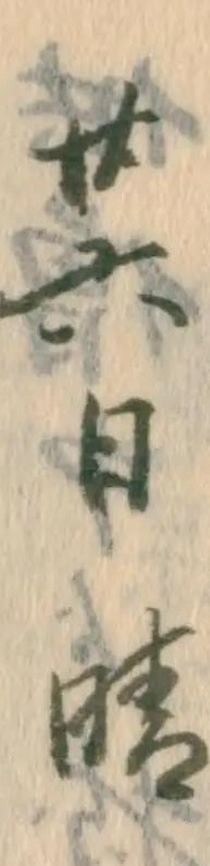廿六日晴
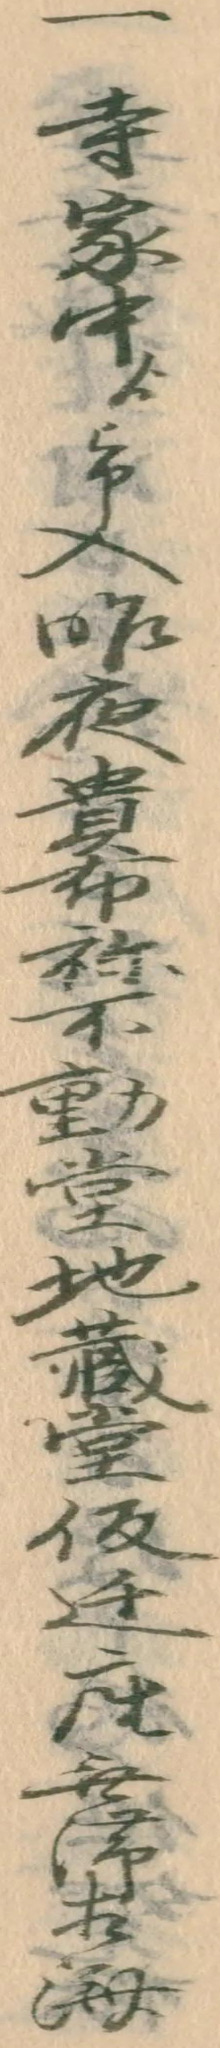一寺家中ゟ被申入昨夜貴布祢不動堂地蔵堂仮迁座無滞相済
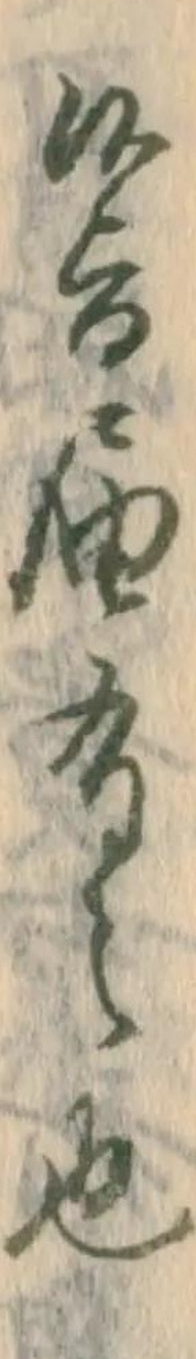候旨届有之也
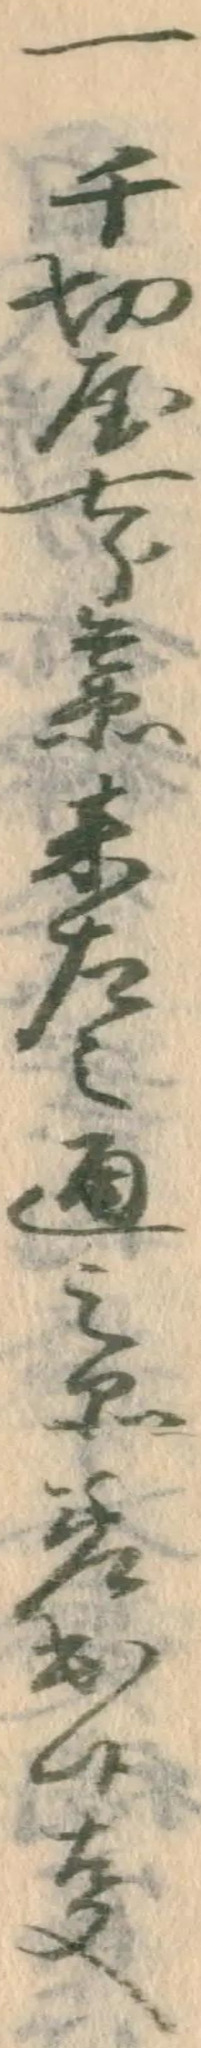一千切屋七郎兵衛来左之通之品差出候事
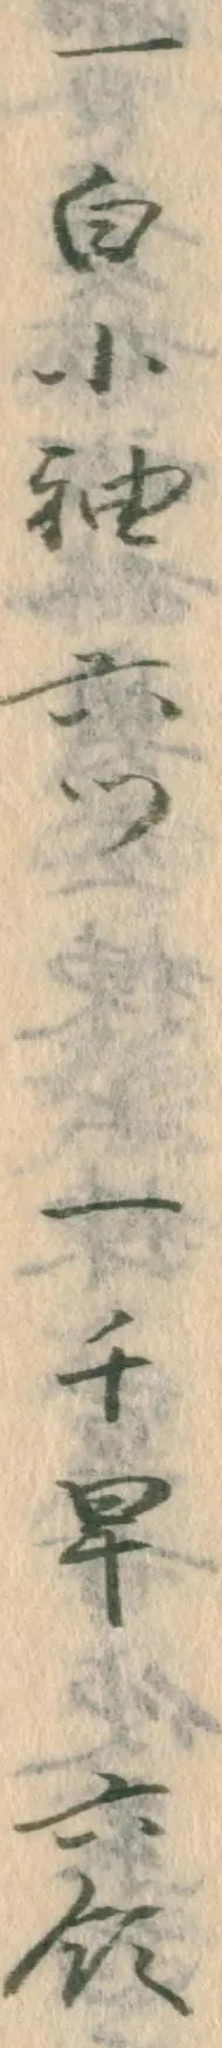一白小袖六ツ一千早六領
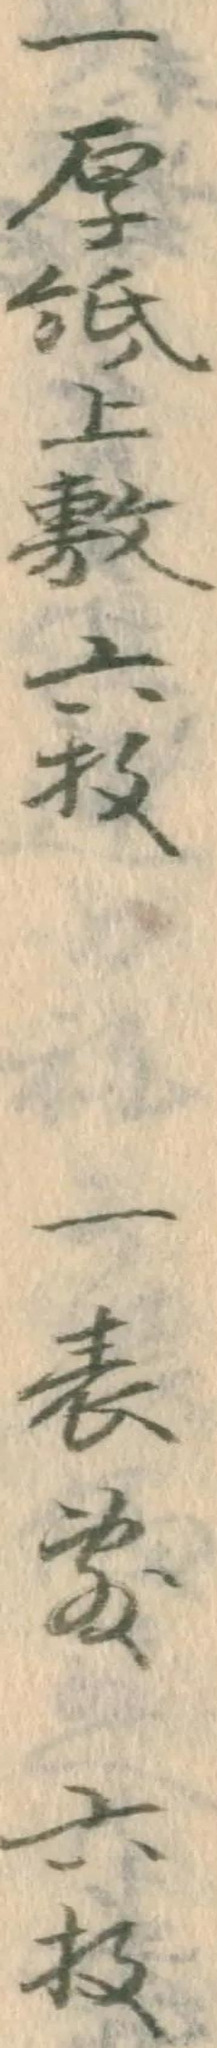一厚紙上敷六枚一表敷六枚
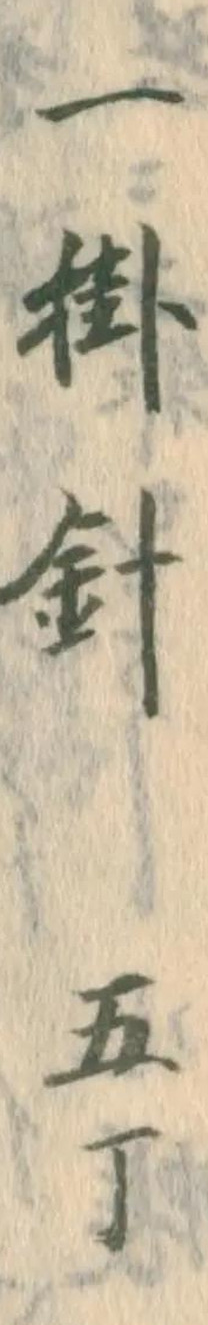一掛針五丁
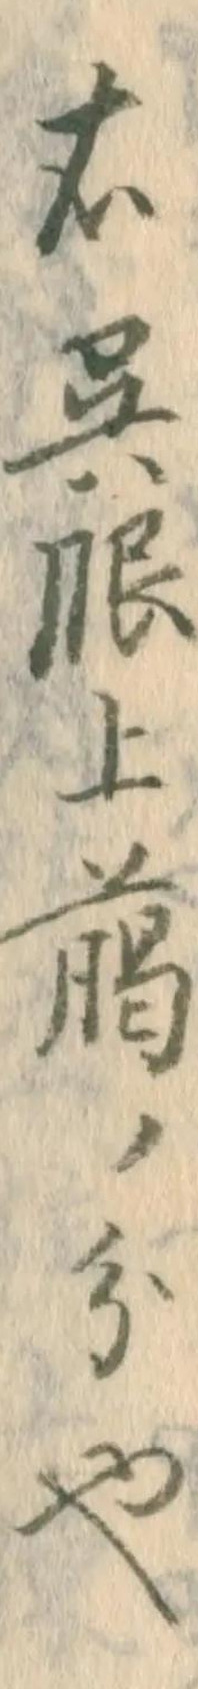右呉服上臈ノ分也
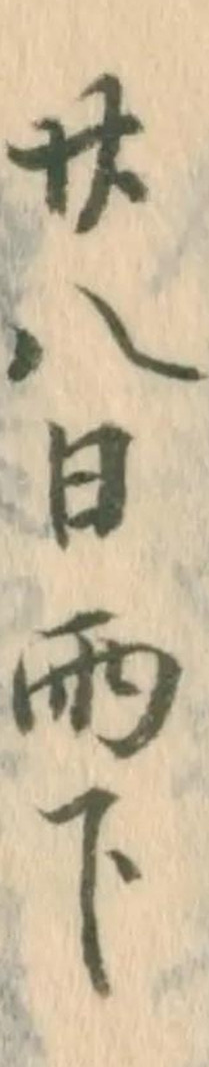廿八日雨下
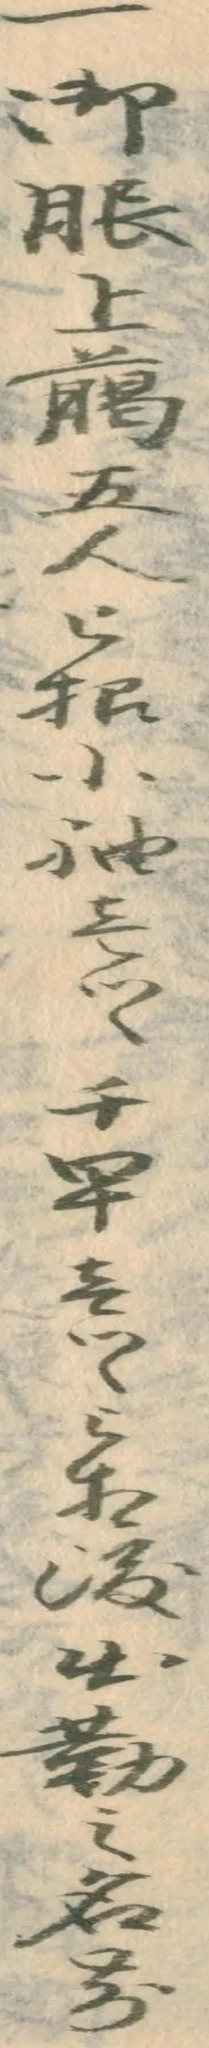一御服上臈五人被招小袖壱ツヽ千早壱ツヽ被相渡出勤之名前
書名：賀茂社記録. 第17冊
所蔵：国立国会図書館 National Diet Library, JAPAN
